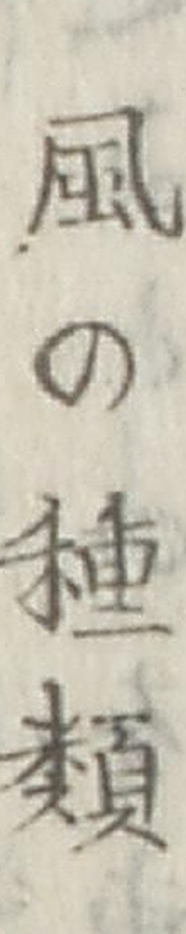風の種類
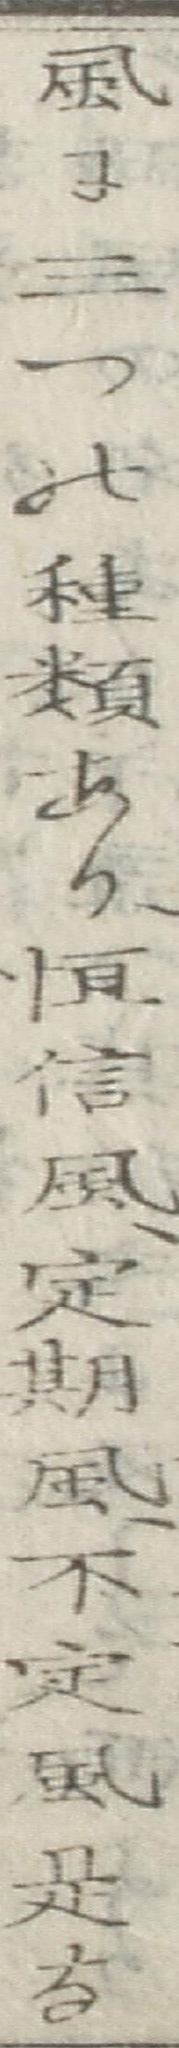風に三つの種類あり、恒信風、定期風、不定風是な
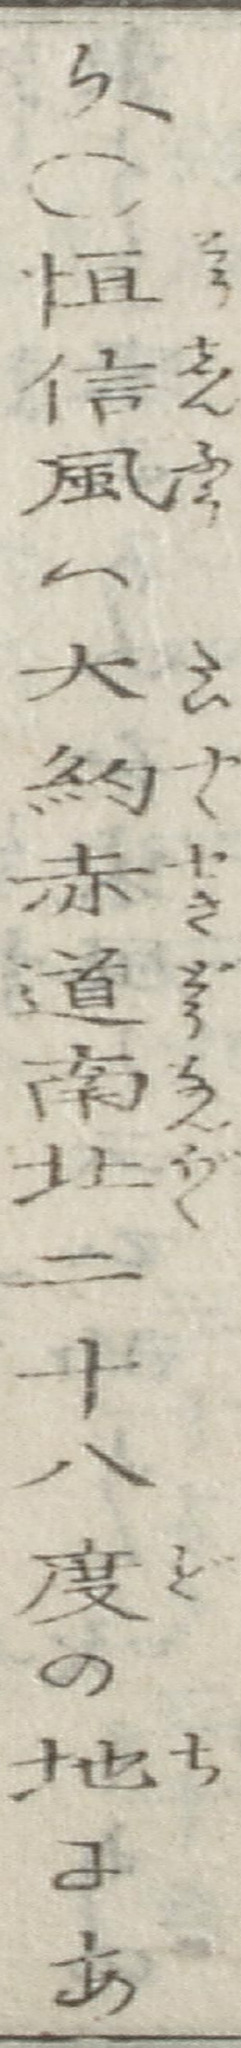り、〇恒信風は大約赤道南北二十八度の地にあ
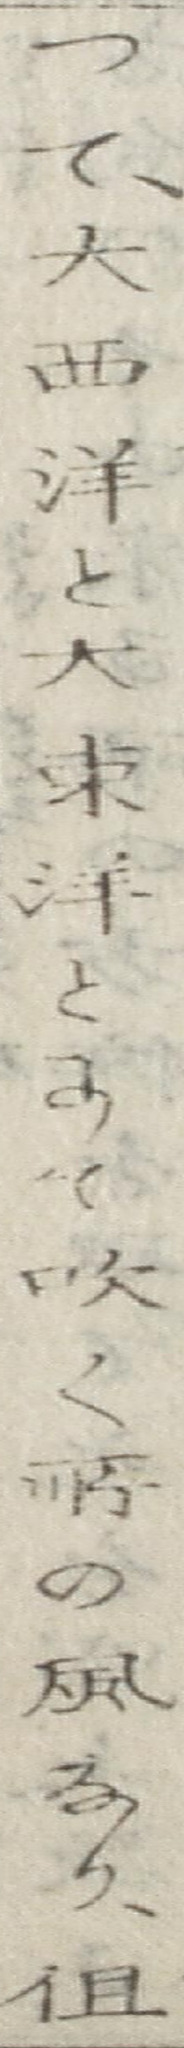つて、大西洋と大東洋とにて吹く所の風なり、但
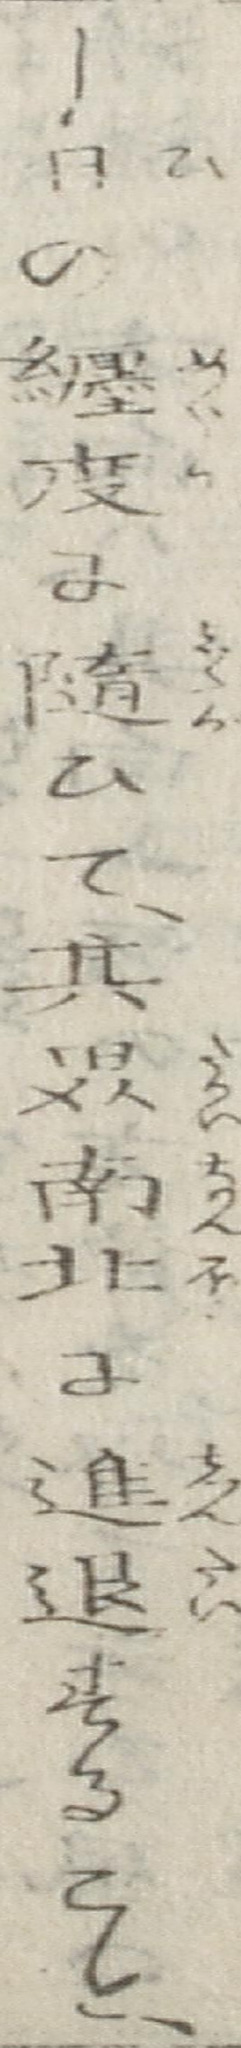し日の纒度に随ひて、其界南北に進退すること、
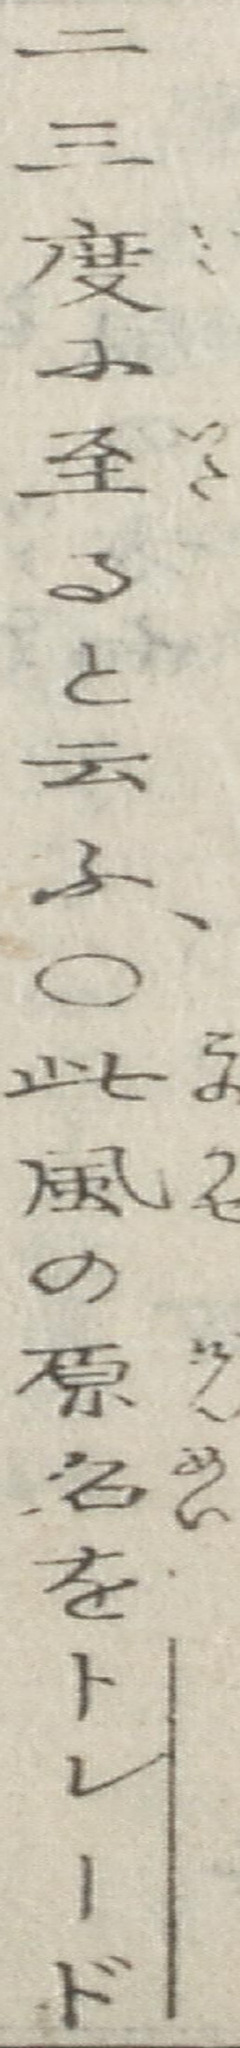二三度に至ると云ふ、〇此風の原名をトレード
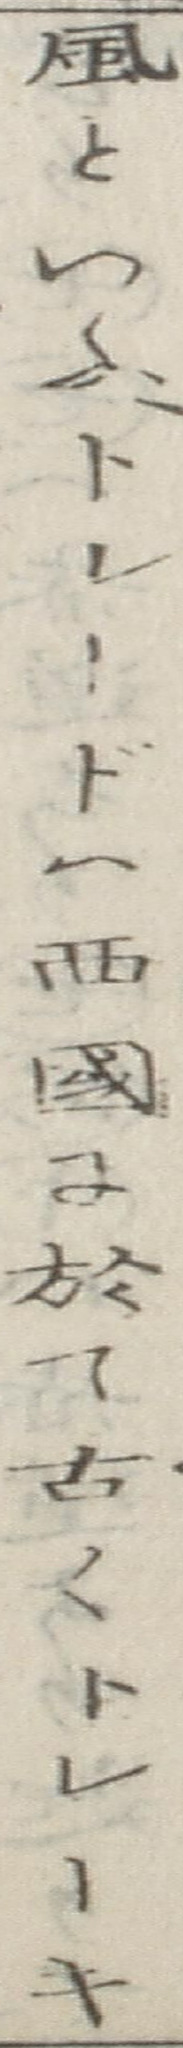風といふ、トレードは西国に於て古くトレーキ
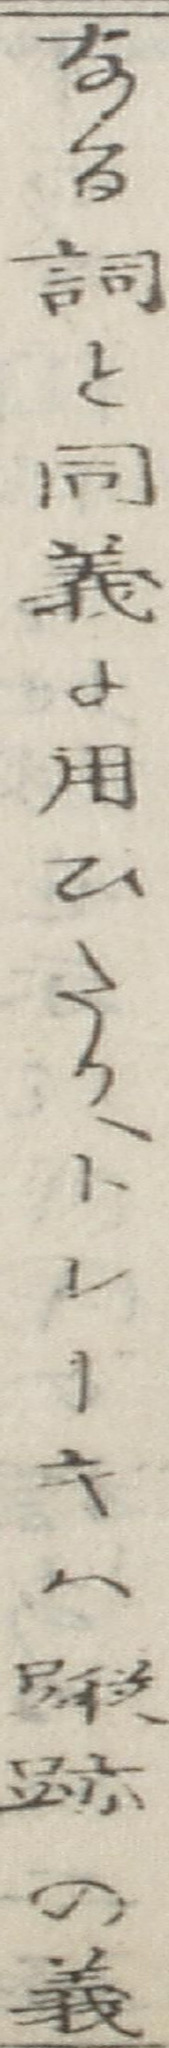なる詞と同義に用ひたり、トレーキは蹤跡の義
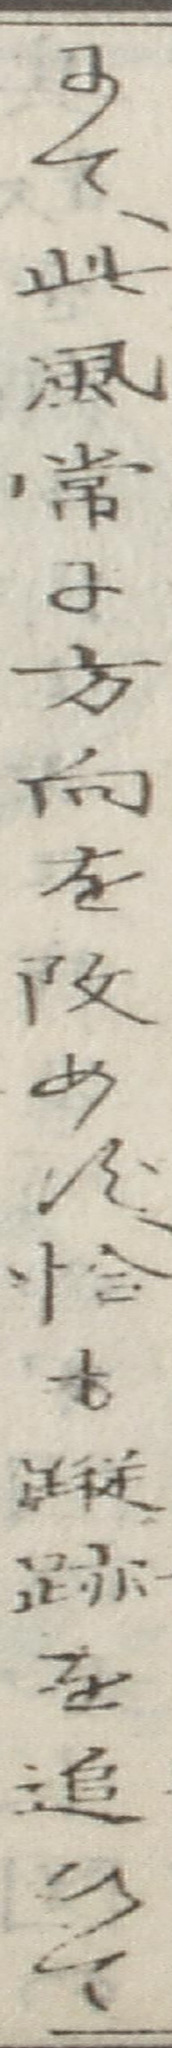にて、此風常に方向を改めず、恰も蹤跡を追ひて
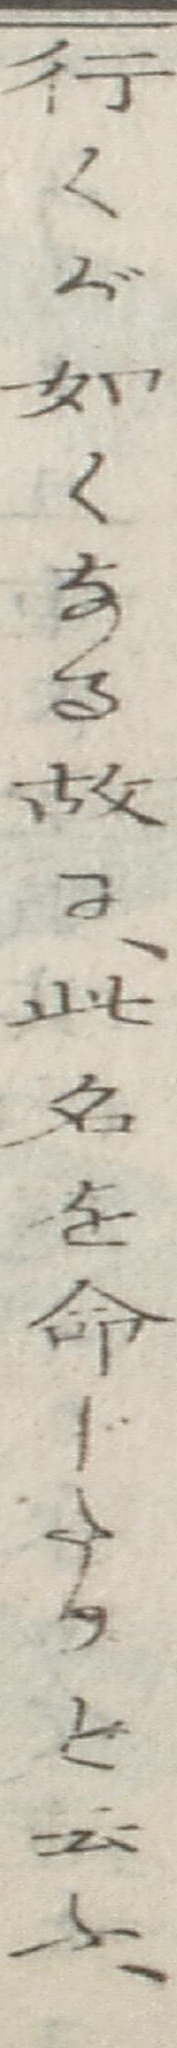行くが如くなる故に、此名を命じたりと云ふ、
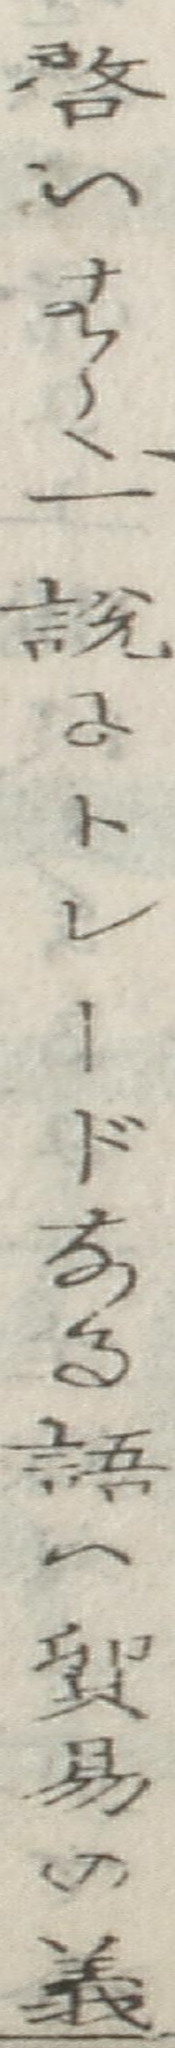啓いはく、一説にトレードなる語は貿易の義
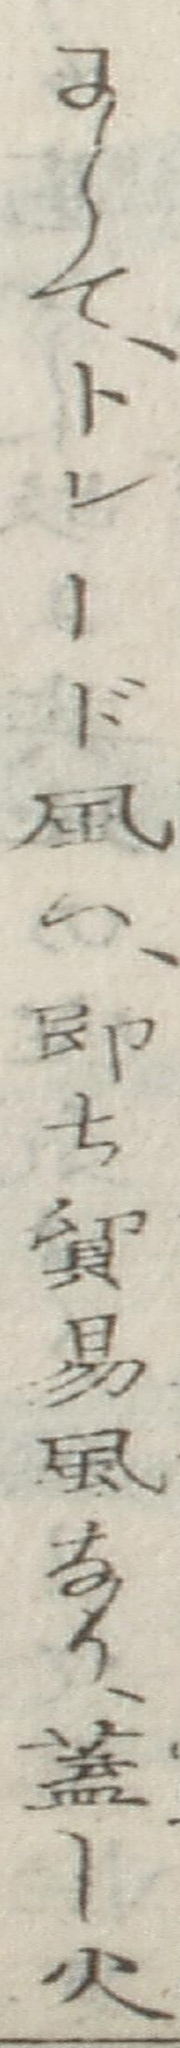にして、トレード風は、即ち貿易風なり、蓋し火
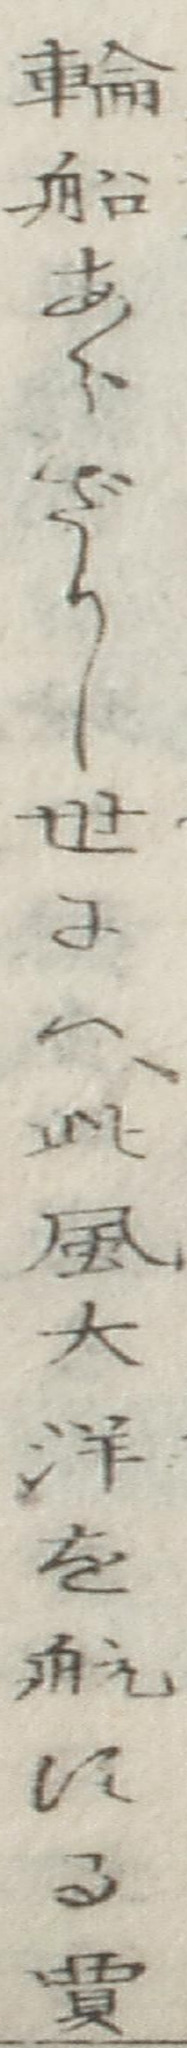輪船あらざりし世には、此風大洋を航する賈
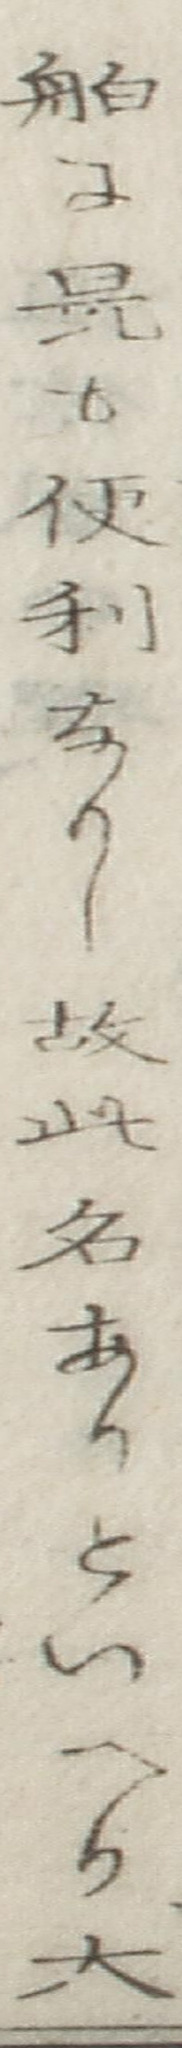舶に最も便利なりし故此名ありといへり、大
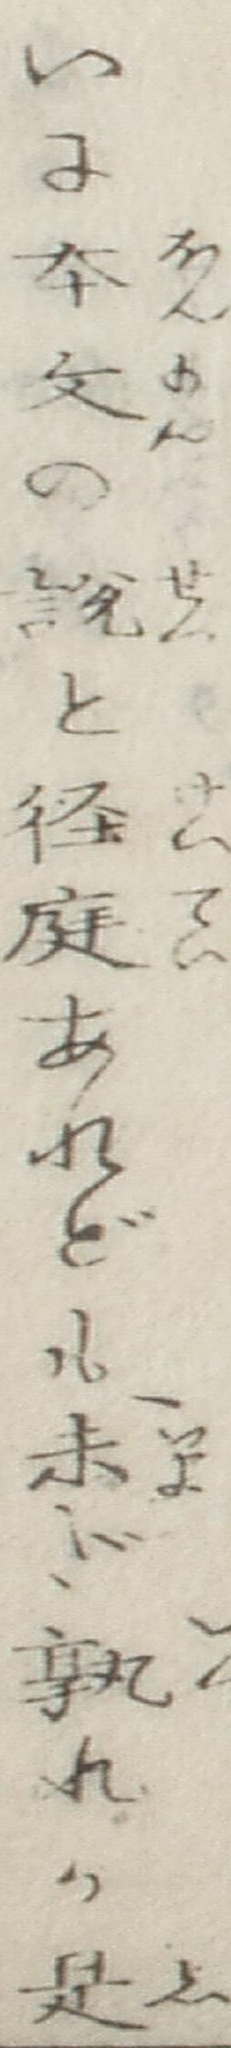いに本文の説と径庭あれども、未だ孰れか是

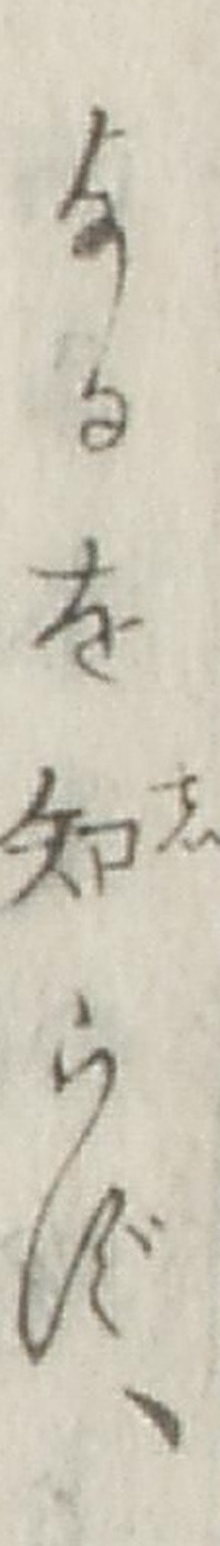なるを知らず、
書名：訓蒙　天然地理學　中
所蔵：東京大学地震研究所図書室 Earthquake Research Institute Library, The University of Tokyo, JAPAN
